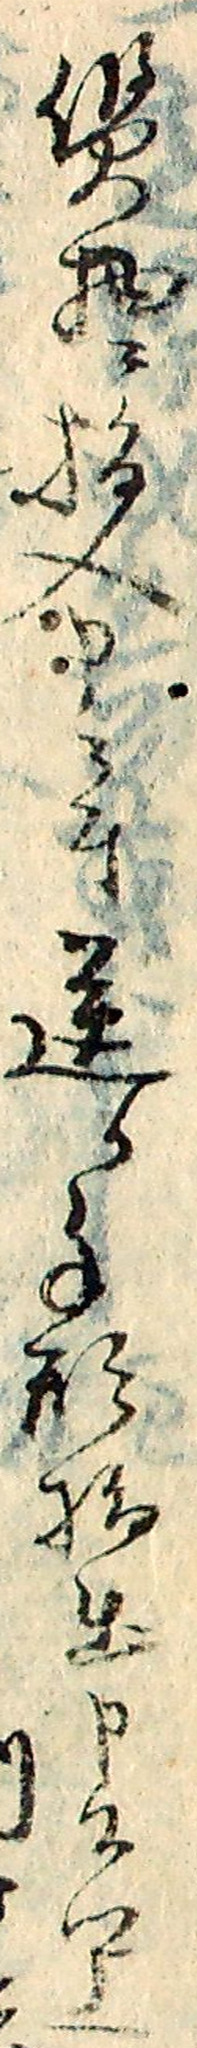質物に指入申に付送り手形指出申候以上
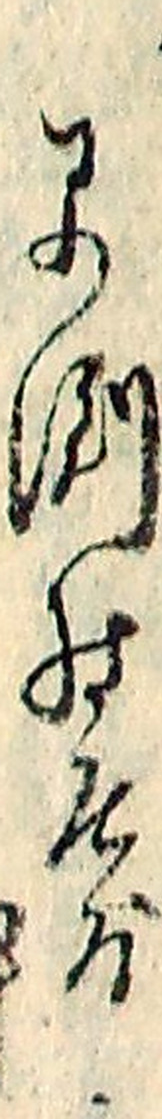早淵村庄屋
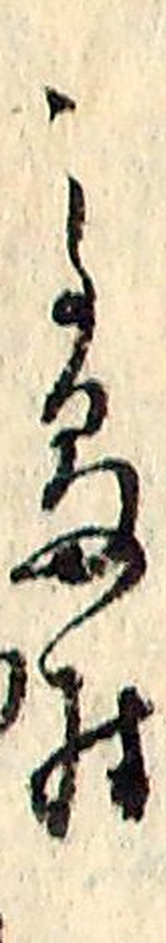高島村
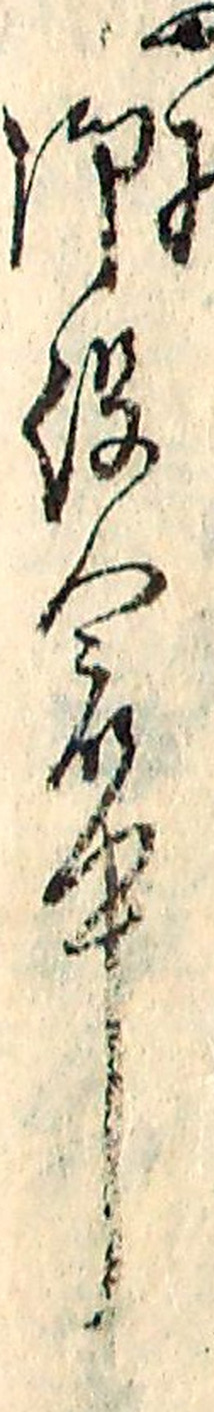御役人衆中

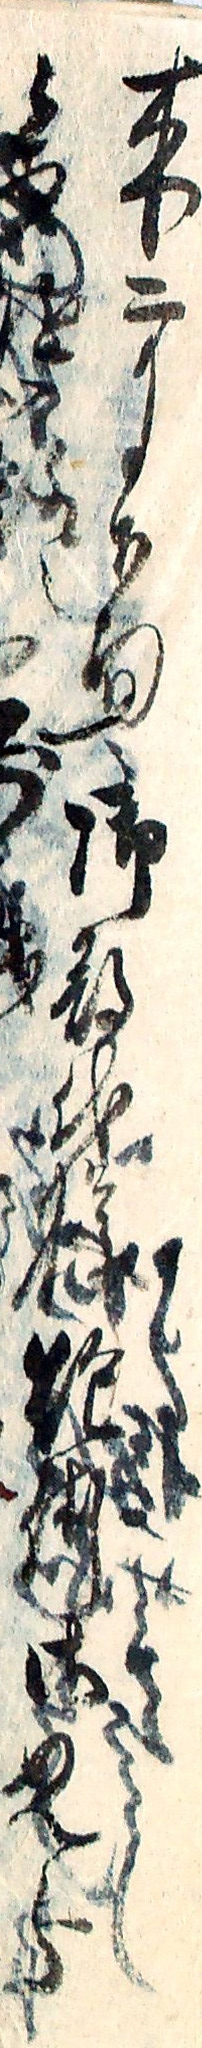来二月下旬に御郡代様炮術御見分
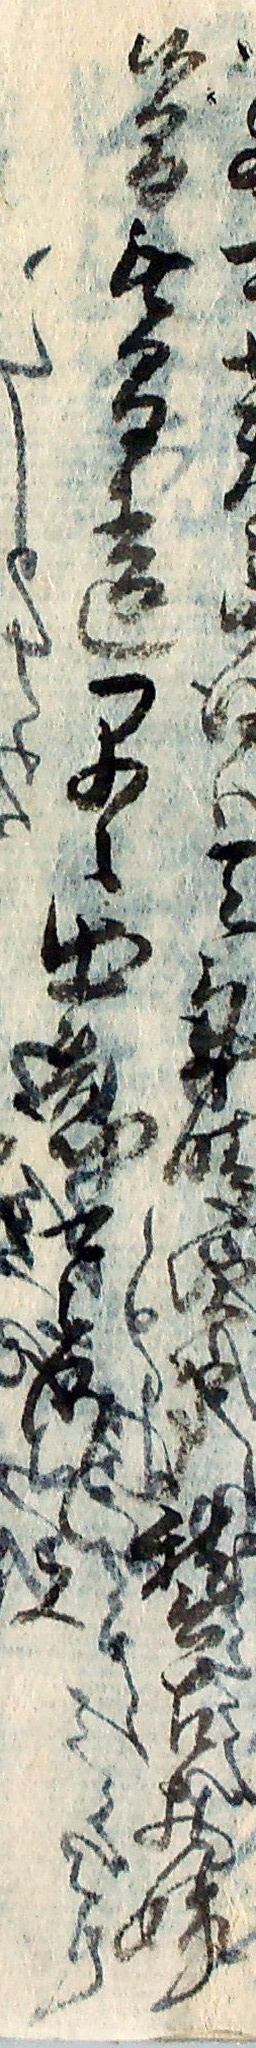候間無間違早々出勤可被成候以上
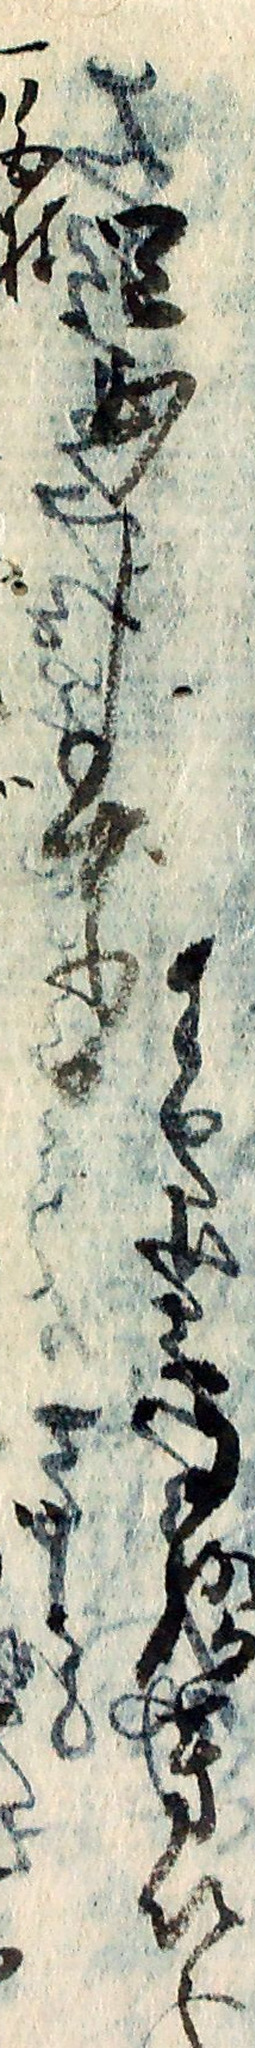閏正月廿五日
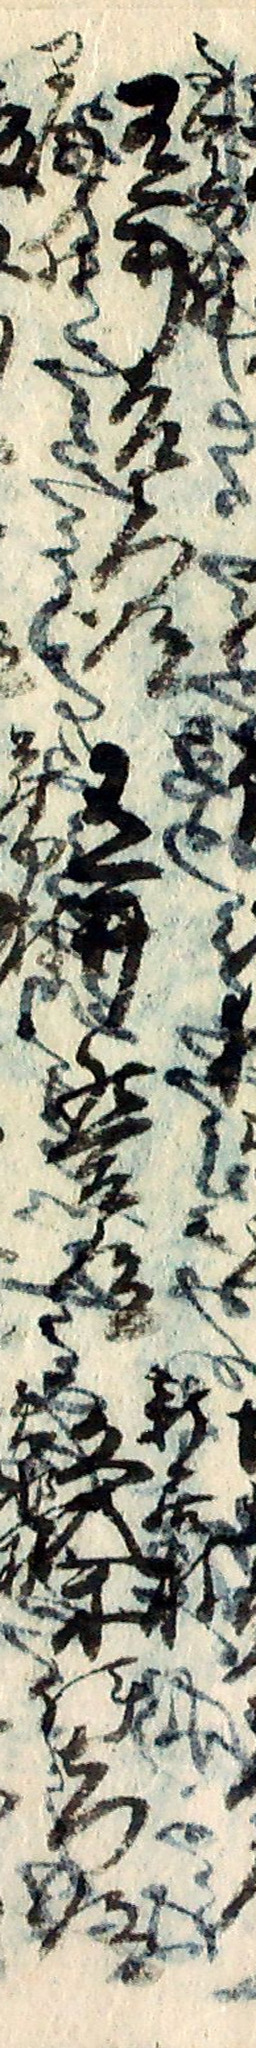有井吉右衛門殿有井熊太殿久須米伊右衛門
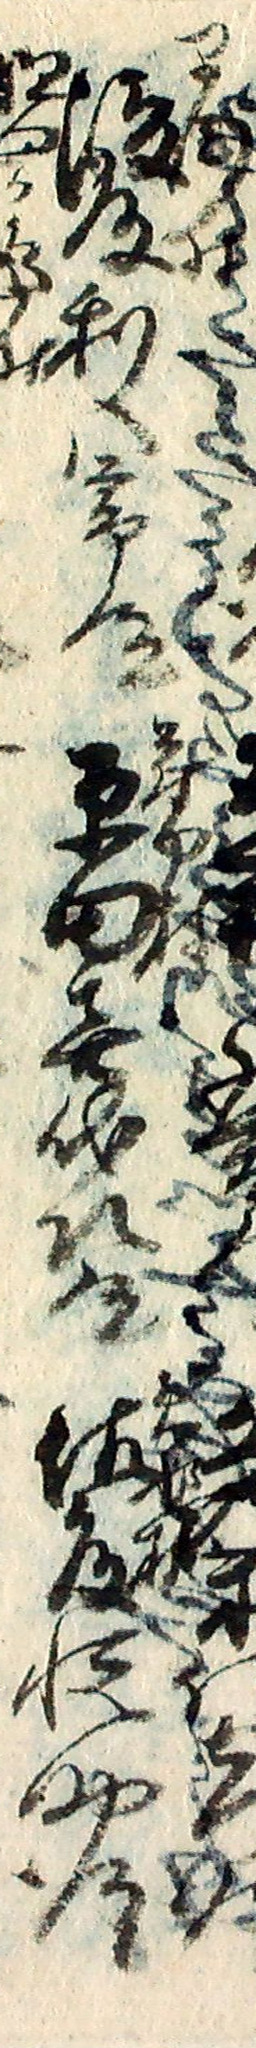後藤利八郎殿原田喜代次殿佐藤悦助殿
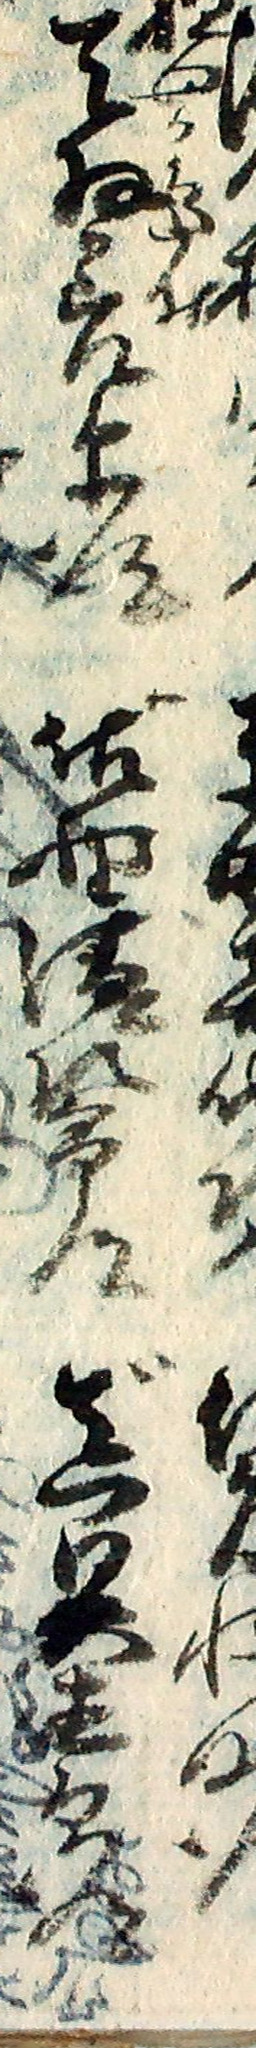天羽善兵衛殿佐野清次郎殿真貝直兵衛殿
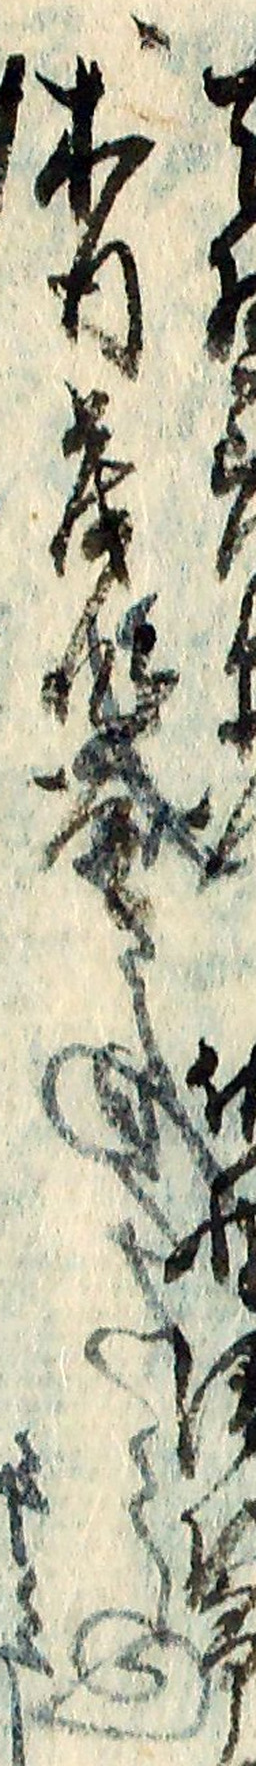木内茂作殿
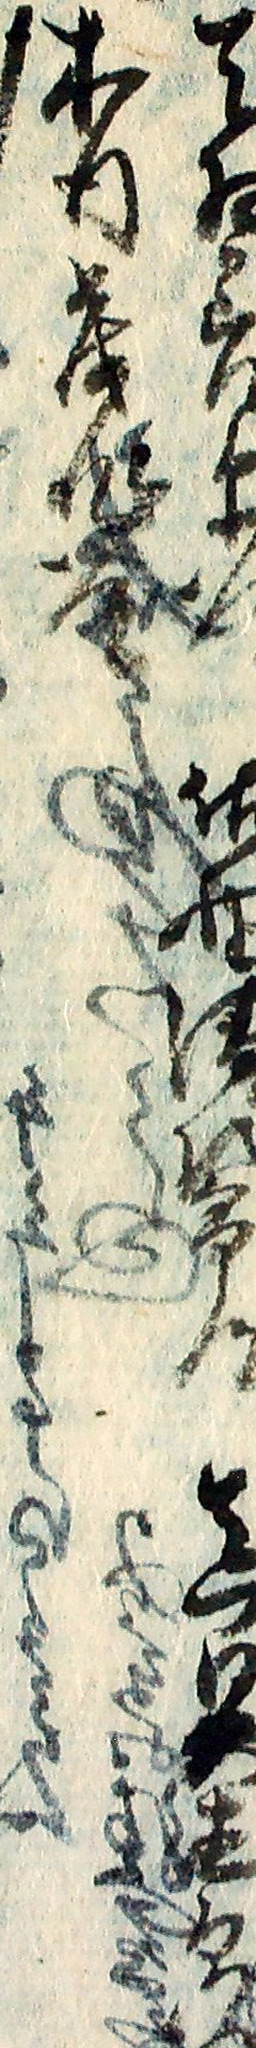木内茂作殿
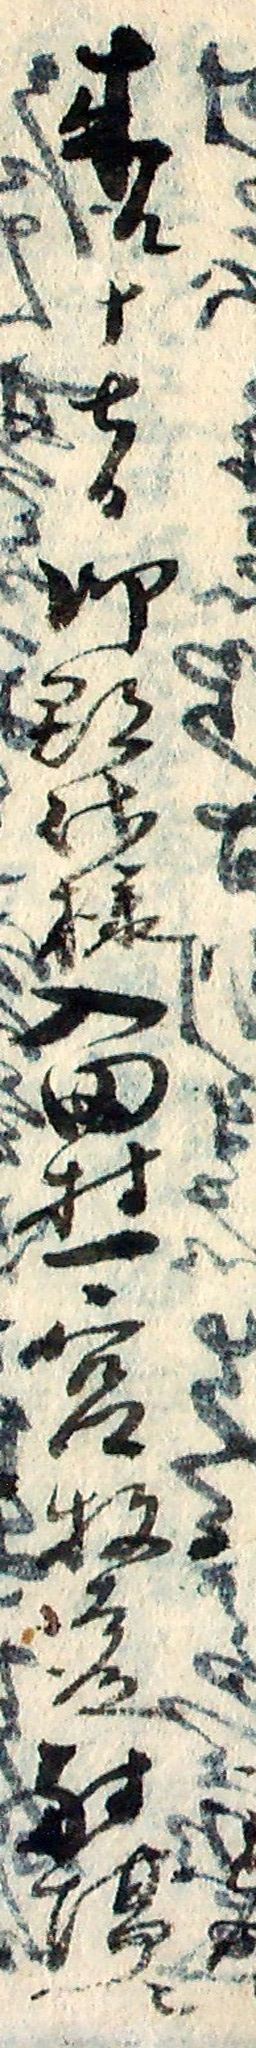来る十七日御郡代様入田村一宮牧大殿射場に
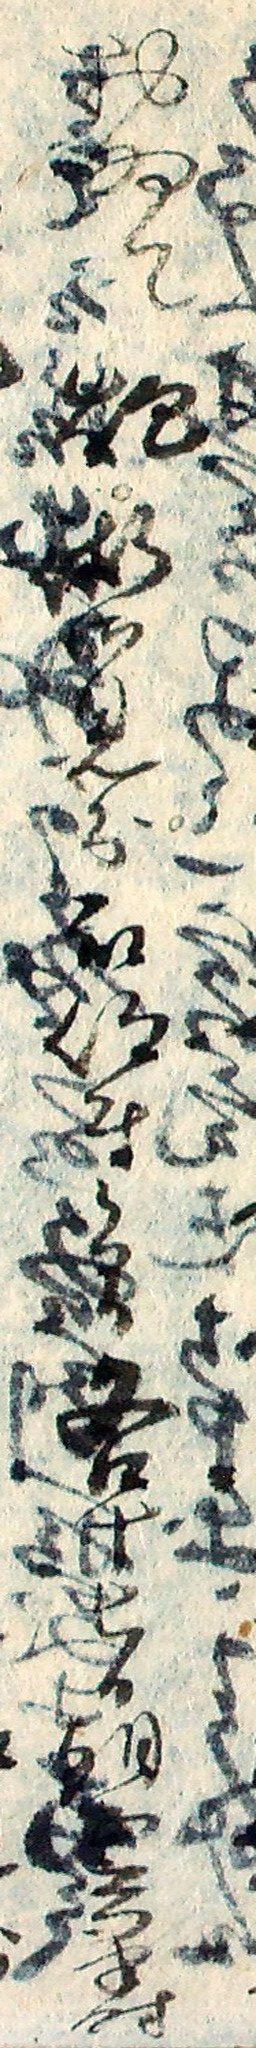おゐて炮術御見分被仰付候間各十七日朝正六つ半時
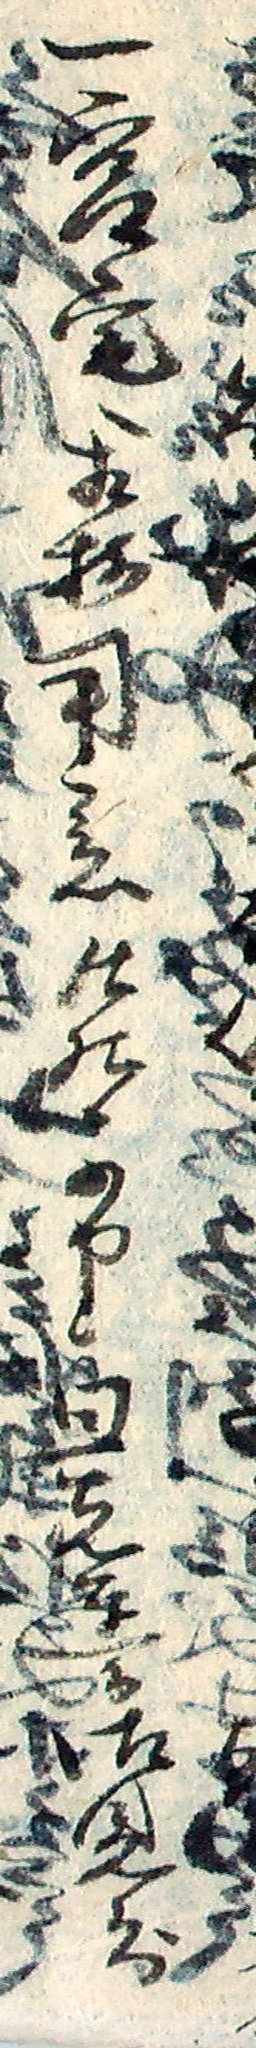一宮宅へ相揃用意仕居可申候且先達て御見分
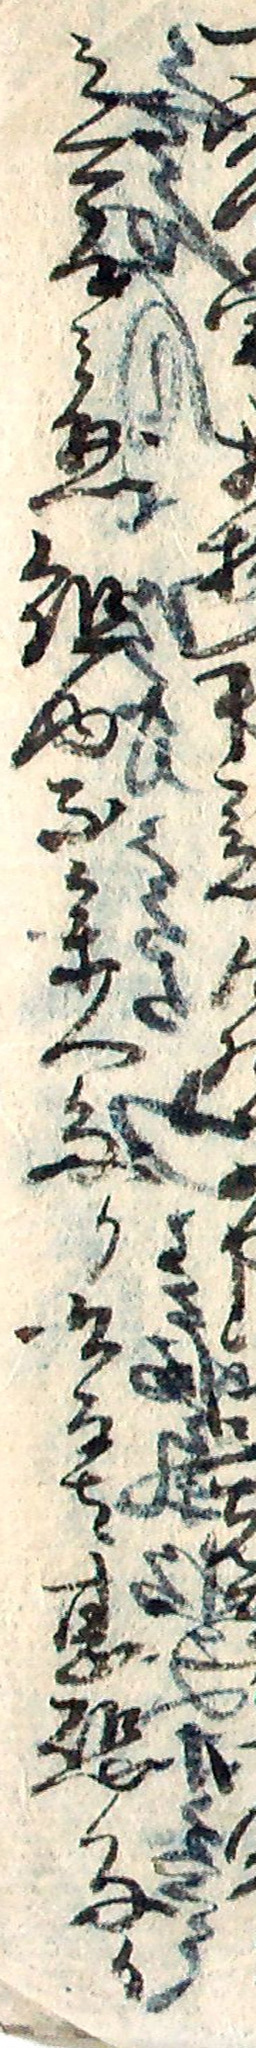之節之懸組内不参人多く候ては甚恐多く
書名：諸御願書控(後藤氏壱番）
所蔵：鳴門教育大学 Naruto University of Education
